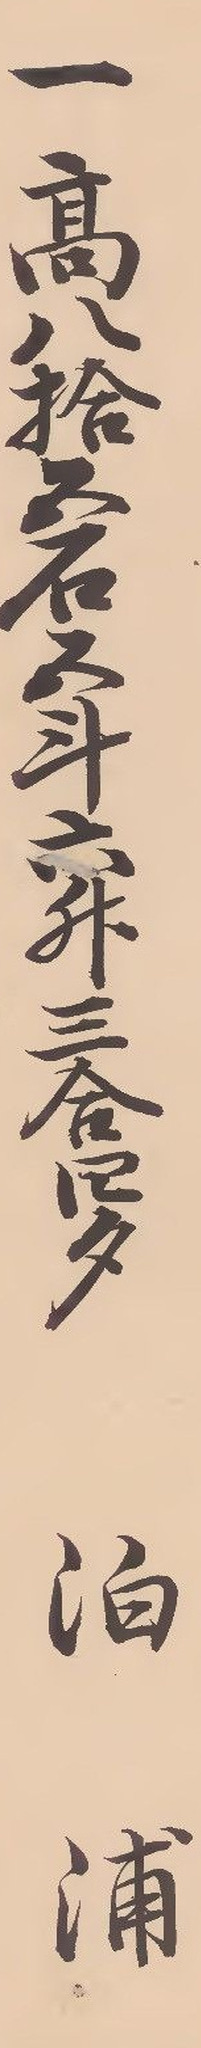一高八拾五石五斗六升三合四勺泊浦

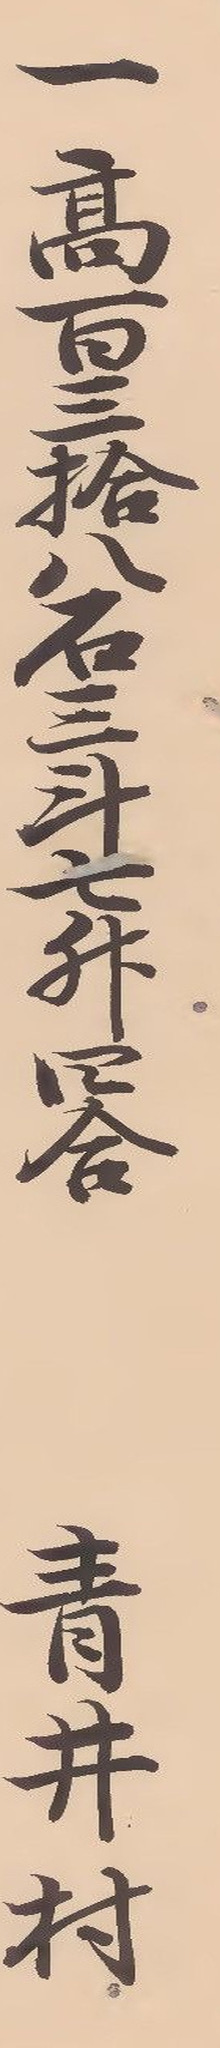一高百三拾八石三斗七升四合青井村
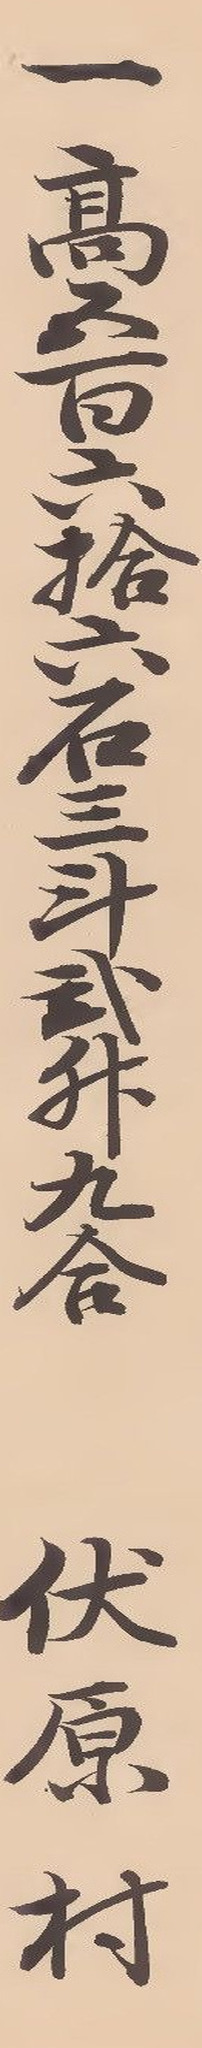一高五百六拾六石三斗弐升九合伏原村
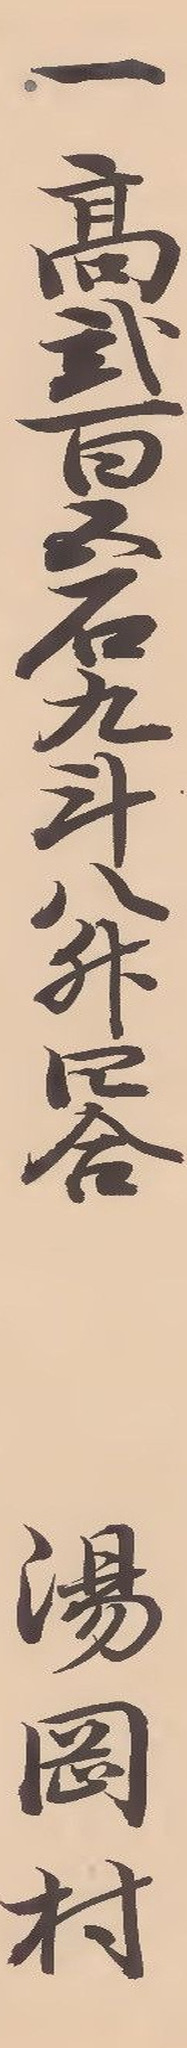一高弐百五石九斗八升四合湯岡村
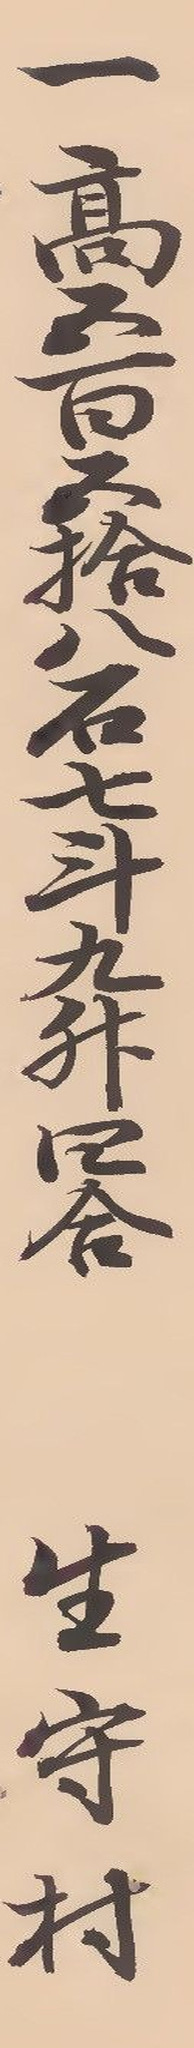一高五百五拾八石七斗九升四合生守村
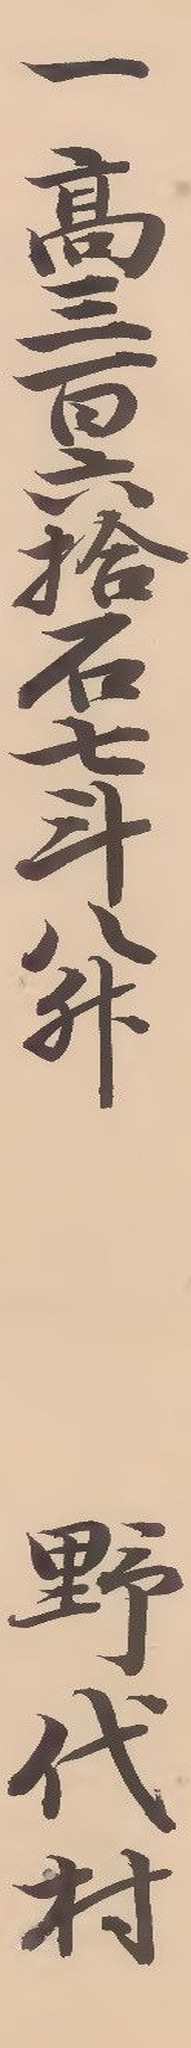一高三百六拾石七斗八升野代村
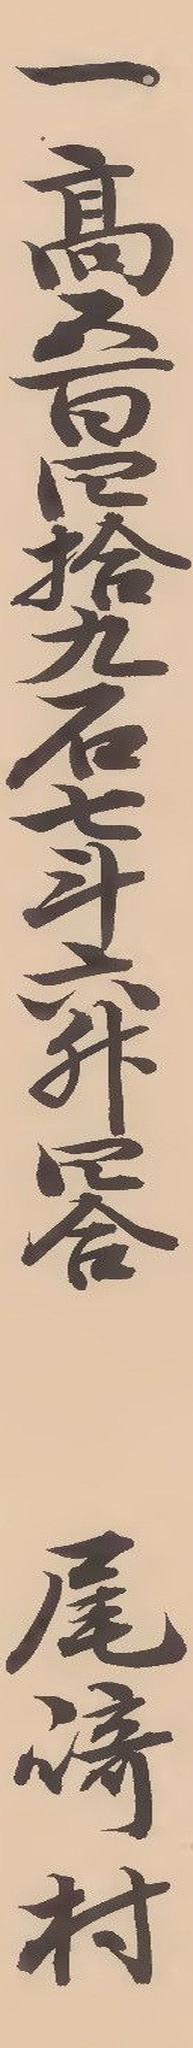一高五百四拾九石七斗六升四合尾崎村
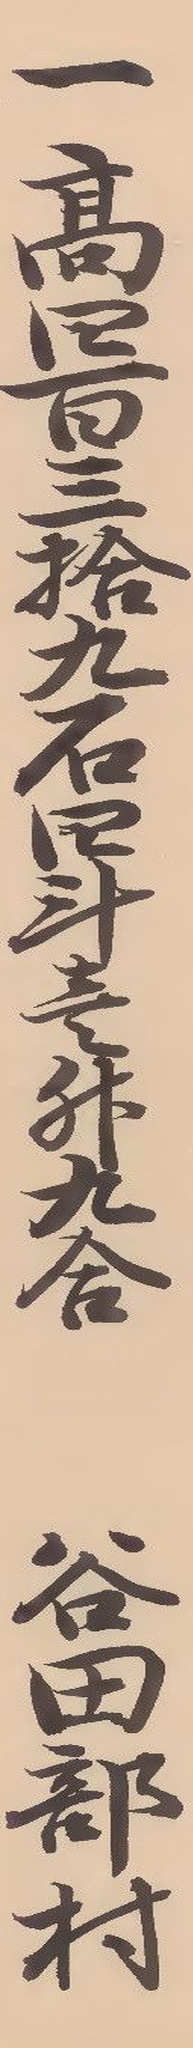一高四百三拾九石四斗壱升九合谷田部村
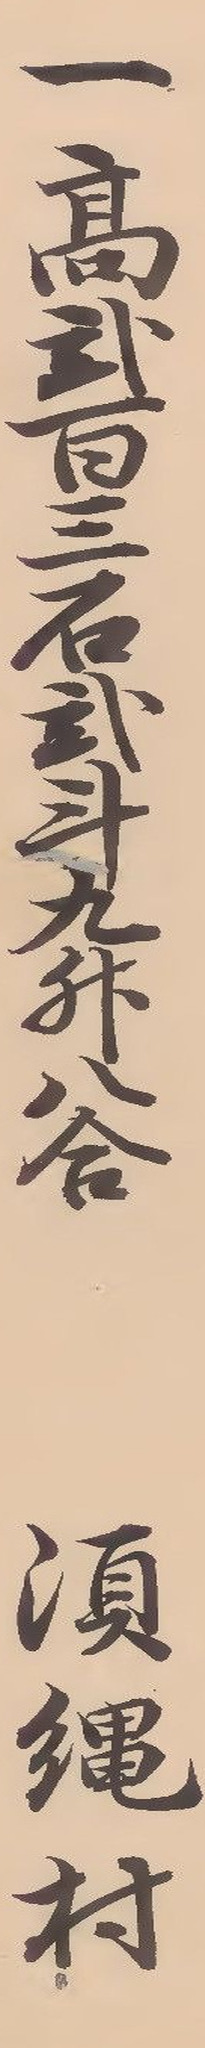一高弐百三石弐斗九升八合須縄村

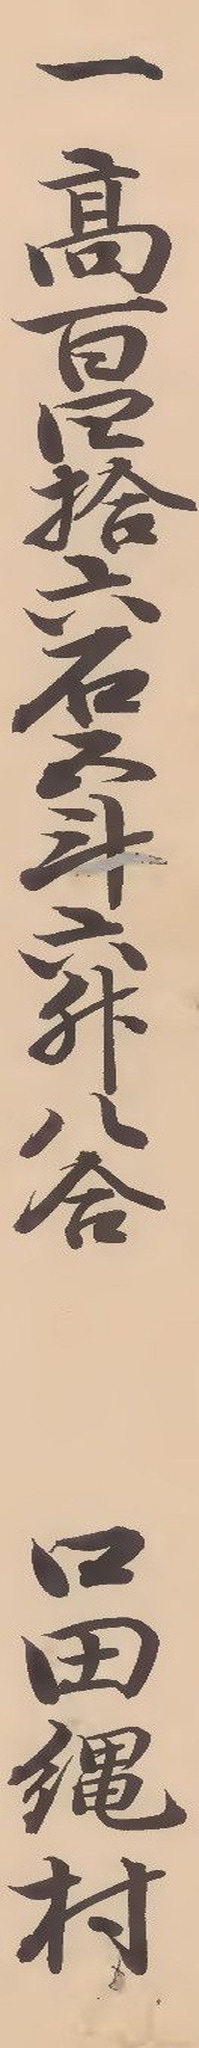一高百四拾六石五斗六升八合口田縄村
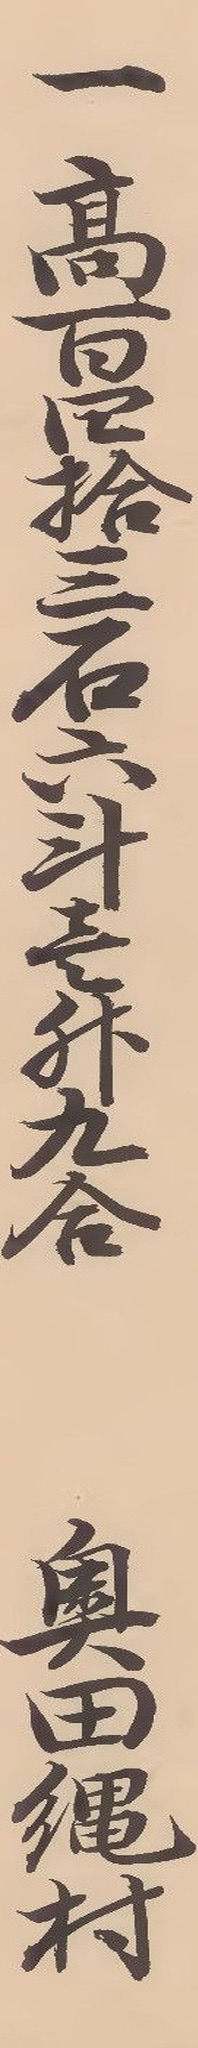一高百四拾三石六斗壱升九合奥田縄村
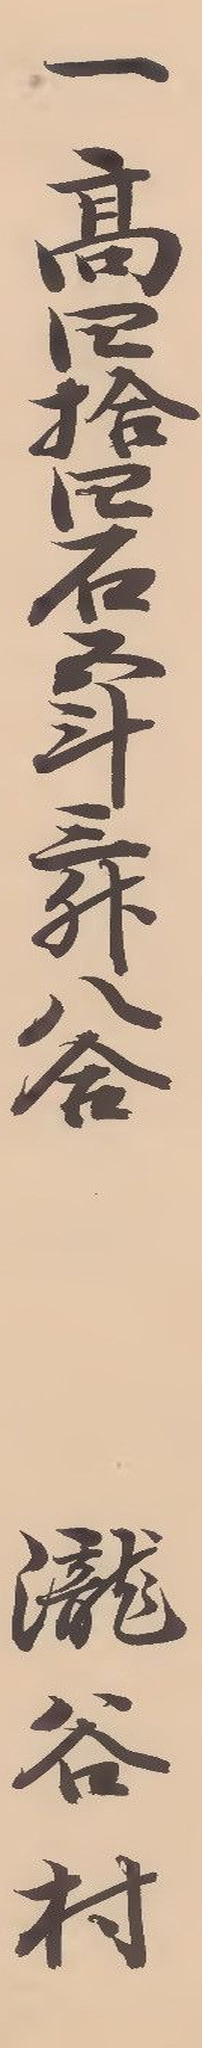一高四拾四石五斗三升八合滝谷村
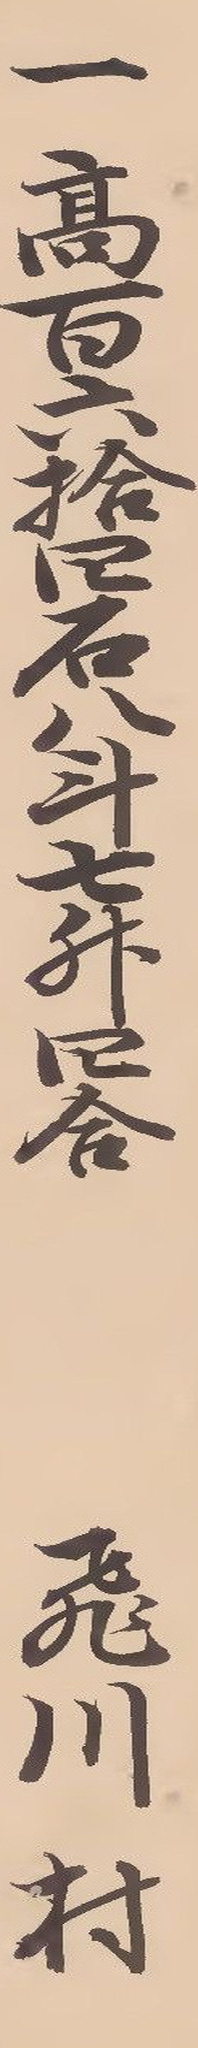一高百六拾四石八斗七升四合飛川村
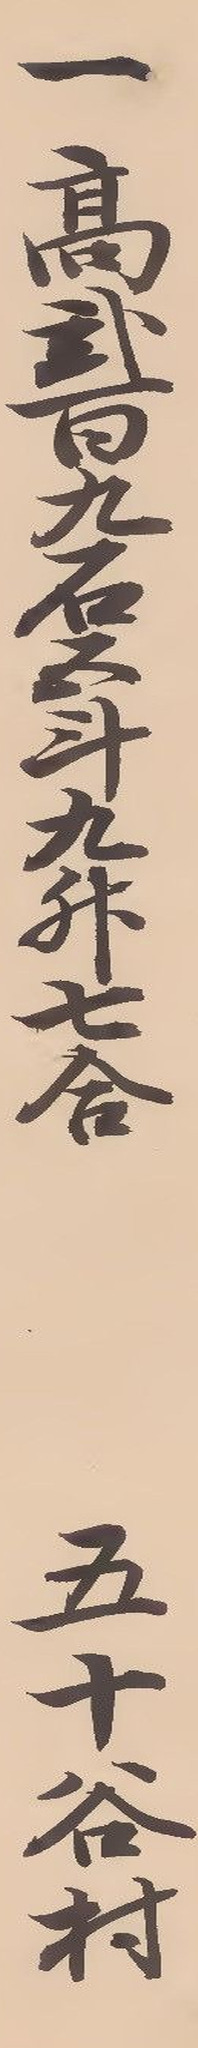一高弐百九石五斗九升七合五十谷村
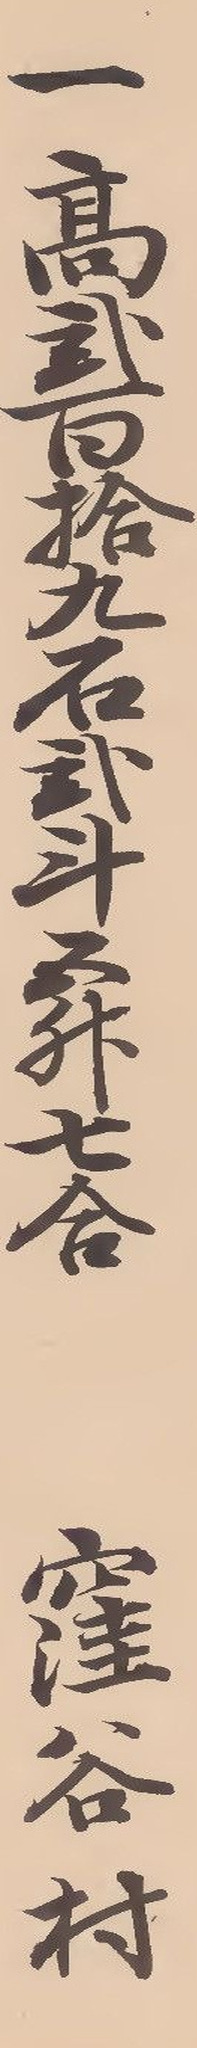一高弐百拾九石弐斗五升七合窪谷村
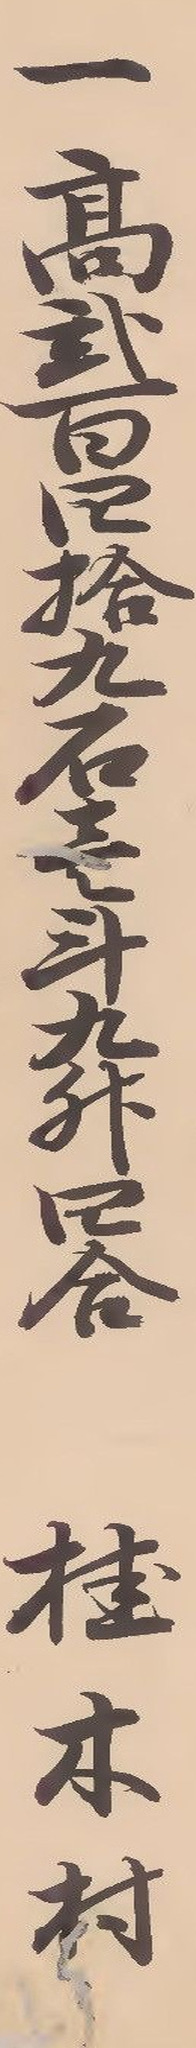一高弐百四拾九石壱斗九升四合桂木村
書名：若狭国郷帳
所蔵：国立公文書館 National Archives of Japan
